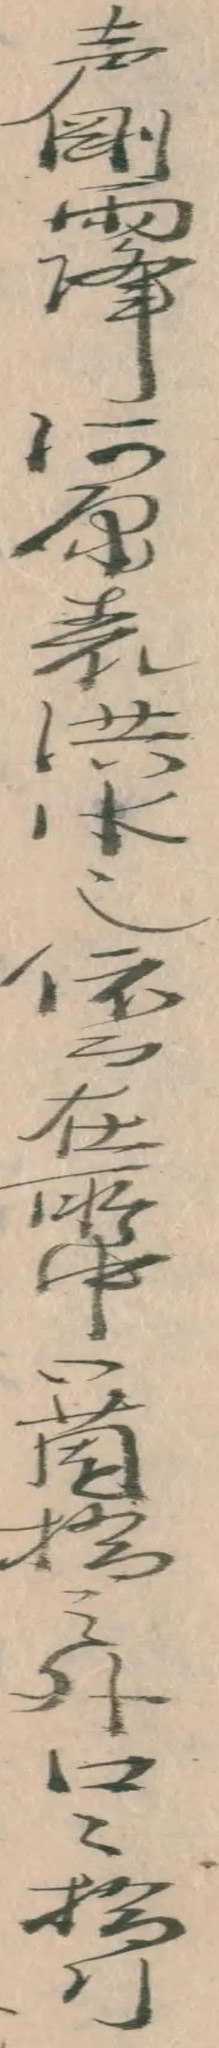声剛雨降河原表洪水也依而在所中御薗橋之外口々橋引
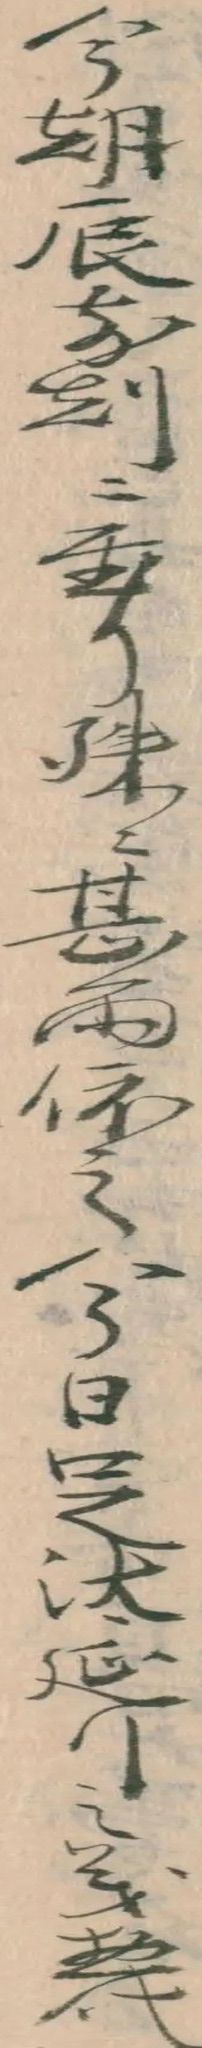今朝辰前刻ニ至り殊ニ甚雨依之今日足汰延引之義惣代
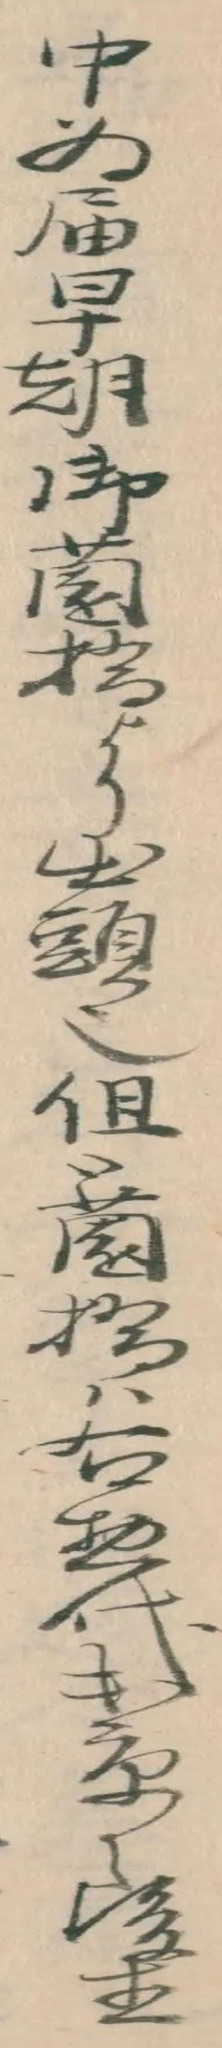中為届早朝御薗橋より出頭也但御薗橋ハ右惣代出京之後直
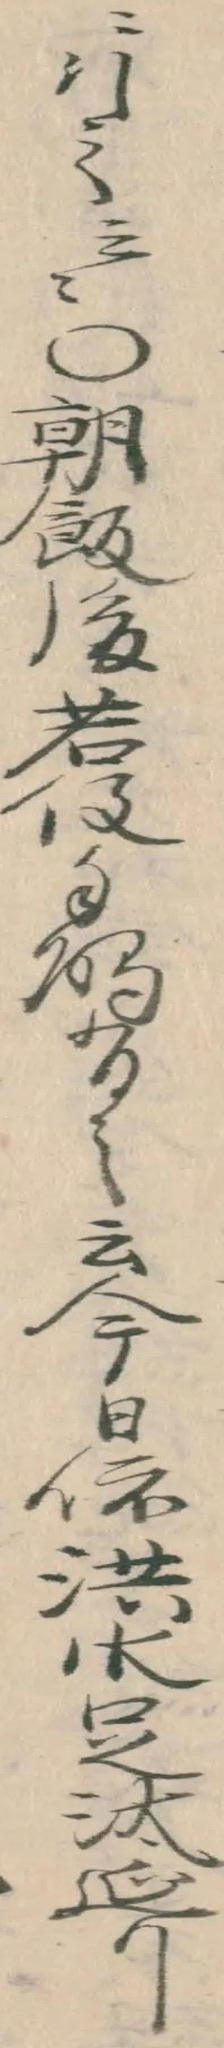ニ引之云々○朝飯後若役手触有之云今日依洪水足汰延引
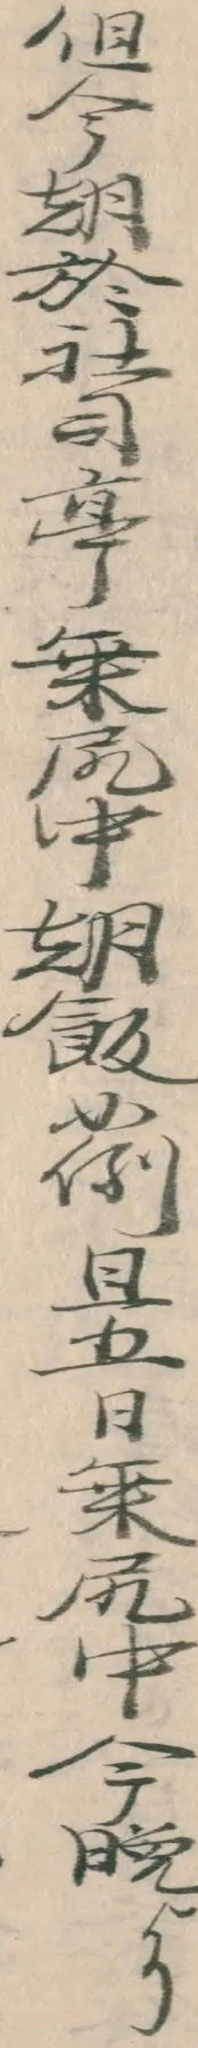但今朝於社司亭乗尻中朝飯如例且五日乗尻仲今晩より
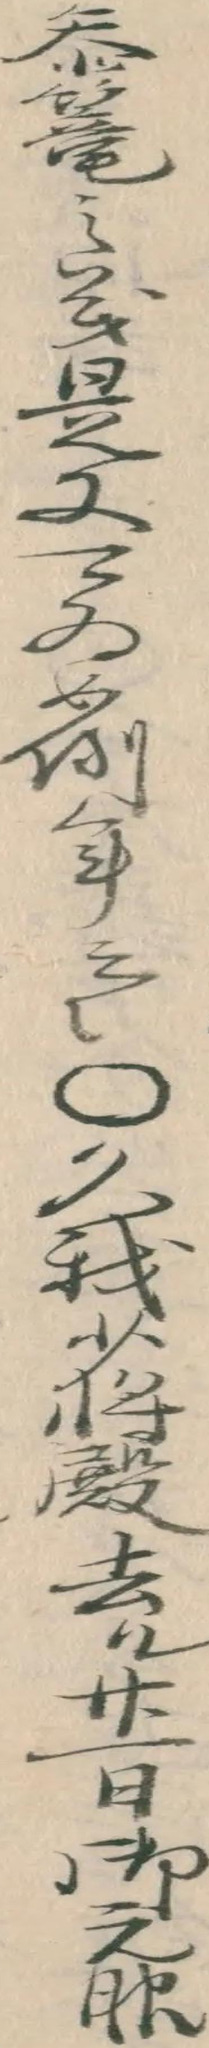参籠之義是又可為如例年云〻○久我少将殿去ル廿一日御元服
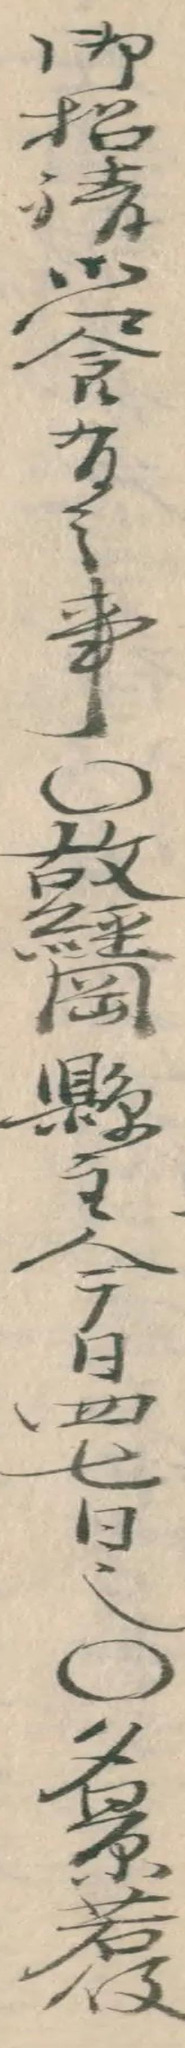御招請御饗有之事○故経岡縣主今日四七日也○夕景若役
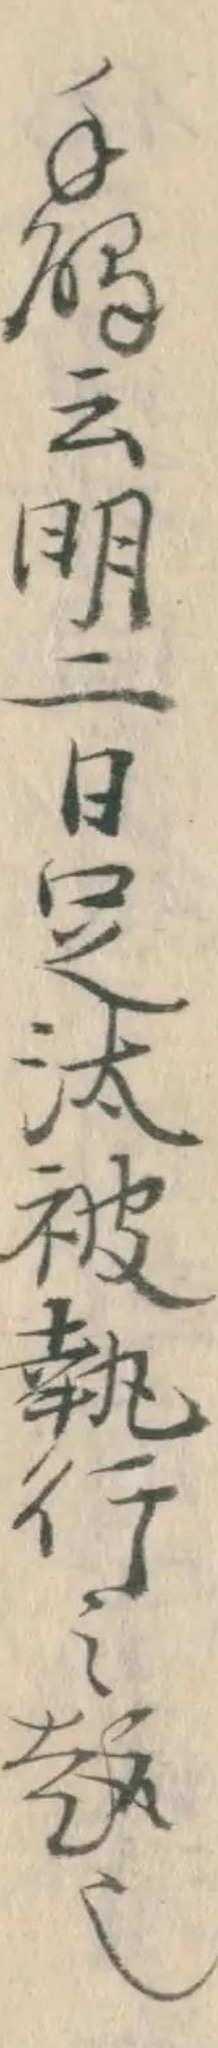手触云明二日足被執行之趣也
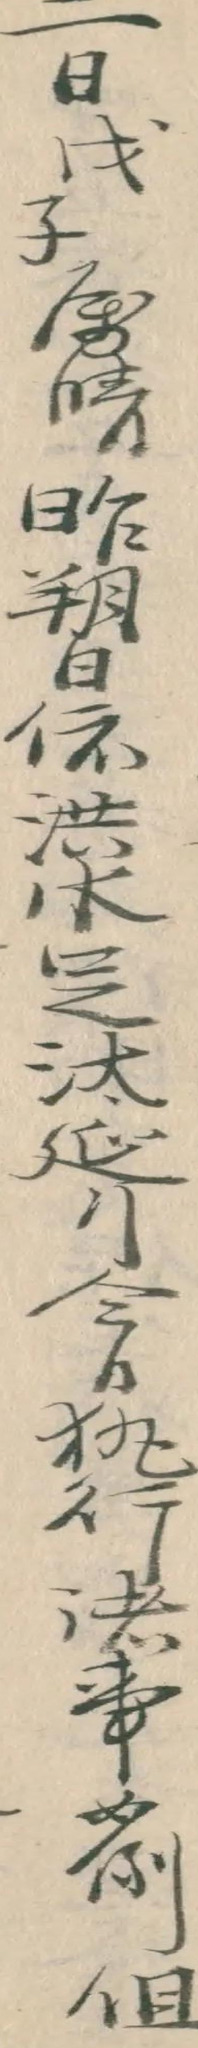二日戊子晴昨朔日依洪水足汰延引今日執行諸事如例但
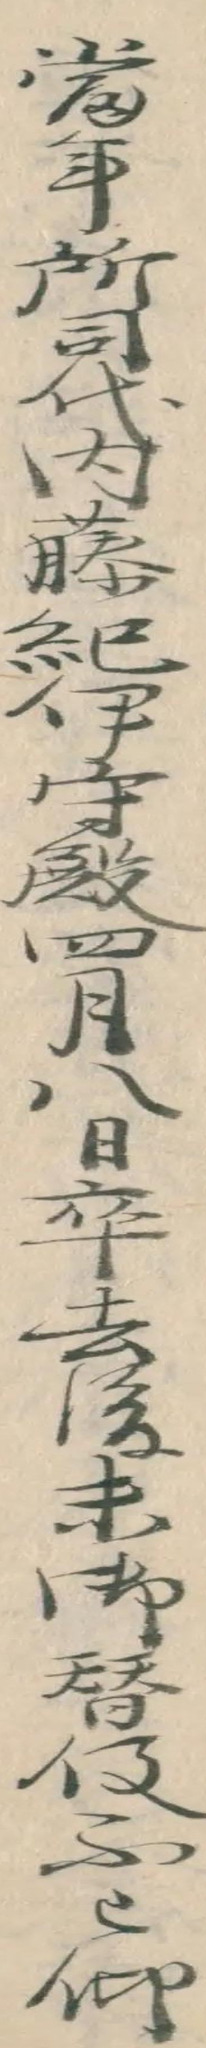當年所司代内藤紀伊守殿四月八日卒去後未御替役不被仰
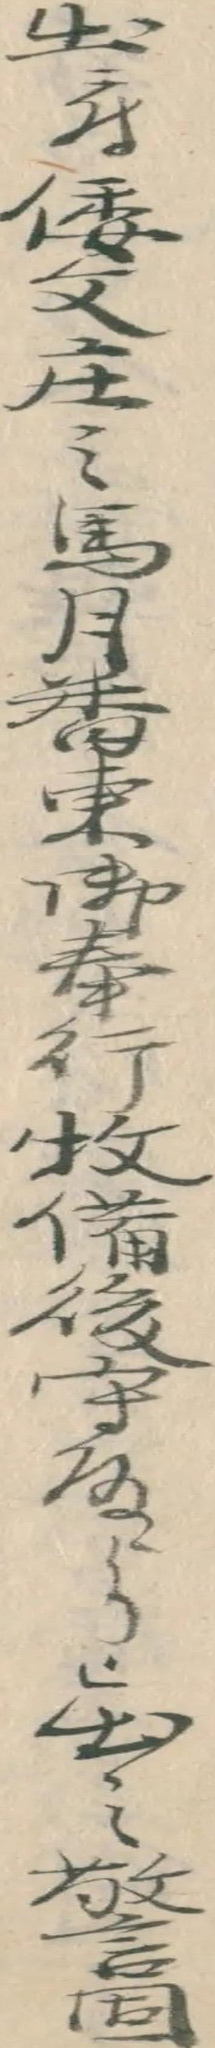出ニ付倭文庄之馬月番東御奉行牧備後守殿より被出之警固
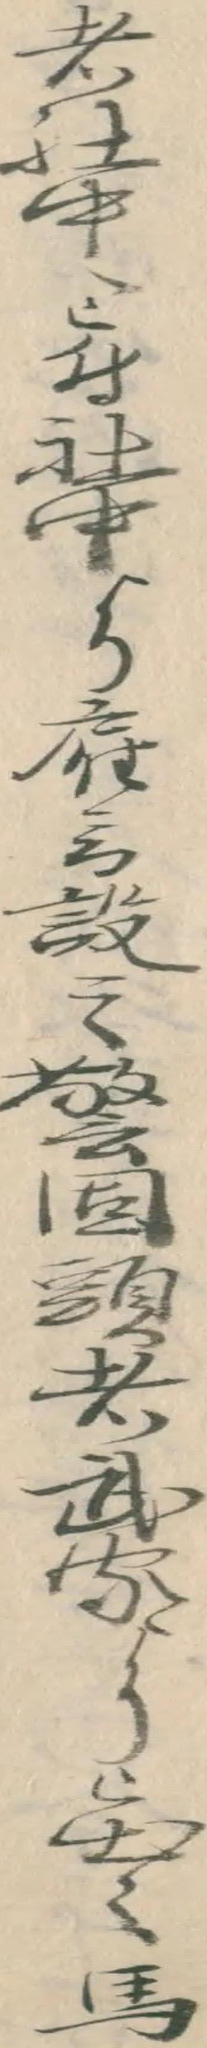者社中へ被付社中より雇ニ而設之警固頭者武家より被出之馬
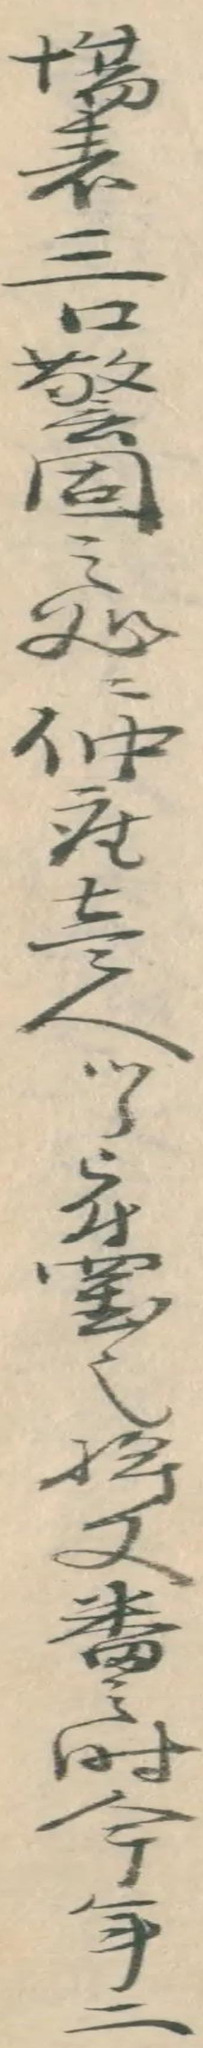場表三口警固之処ニ仲座壱人ツヽ被付置也将又番之時今年二

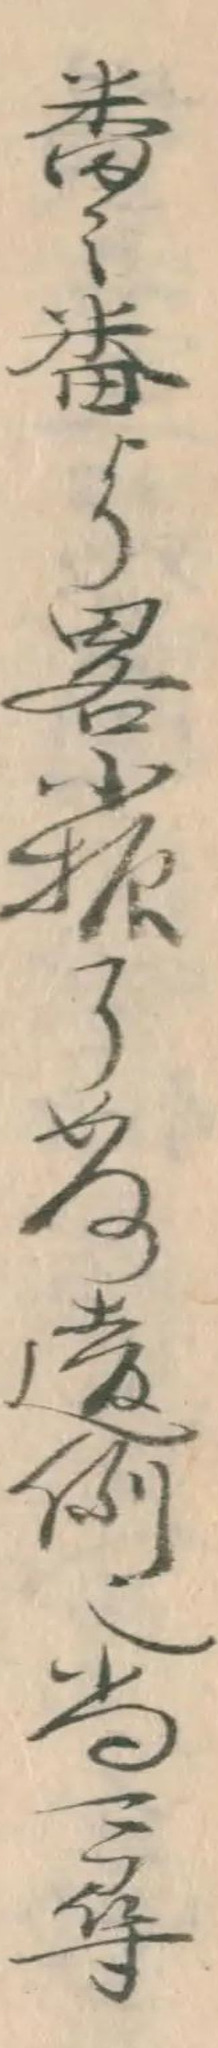番之番より畧小振了如何違例也尚可尋
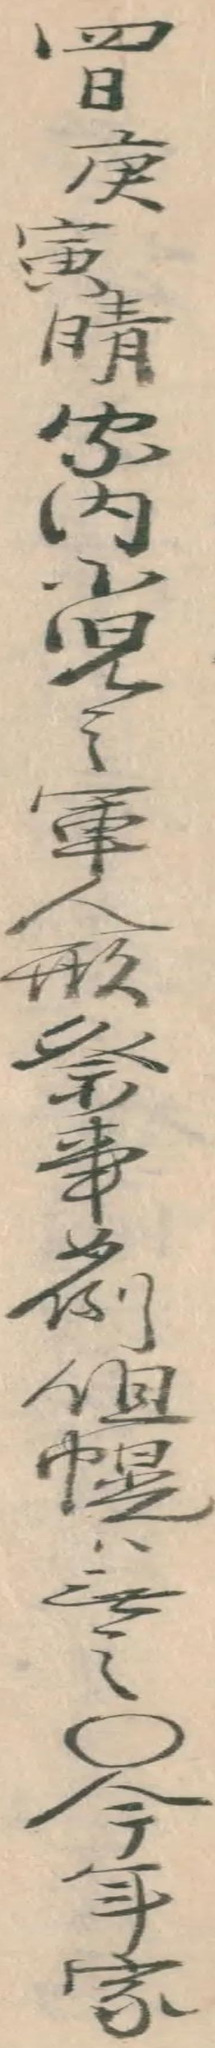四日庚寅晴家内小児之軍人形祭事如例但幌ハ無之○今年家
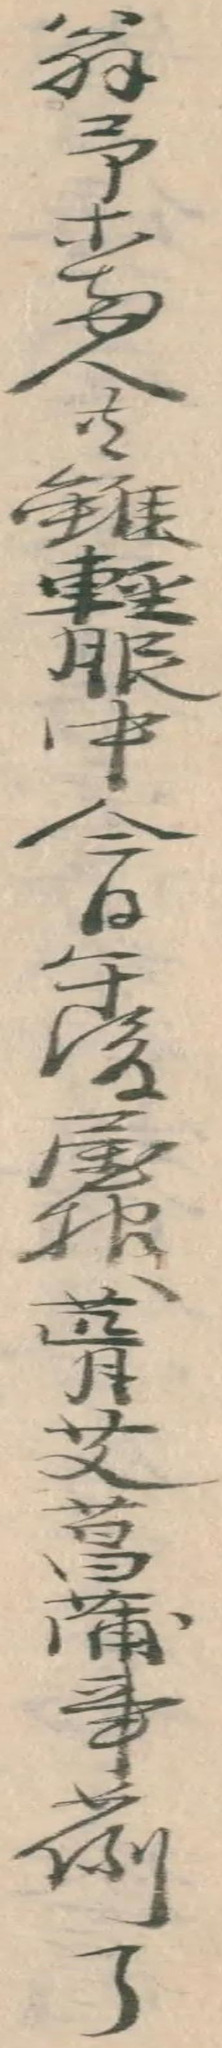翁予等両人共雖軽服中今日午後屋根へ葺艾菖蒲事如例了
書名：賀茂社記録. 第65冊
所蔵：国立国会図書館 National Diet Library, JAPAN
